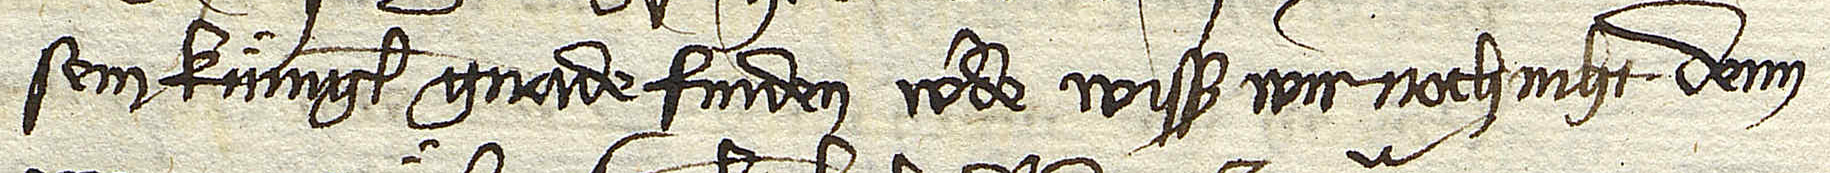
ſein künigl* gnade finden w*de wiſſ* wir noch niht . Denn
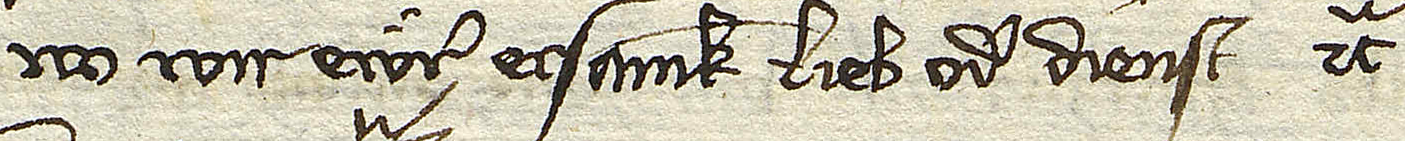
wo wir ew*r erſamk* lieb od* dienſt ec*
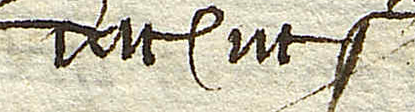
Dat* ut ſ*
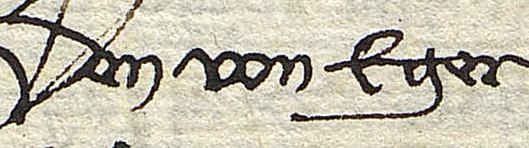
Den von Eger
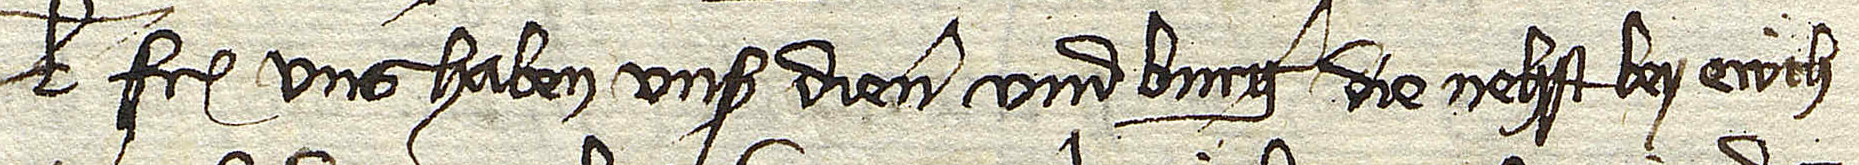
L* fr* vns haben vnſ* dien* vnd burg* / die nehſt bey ewch
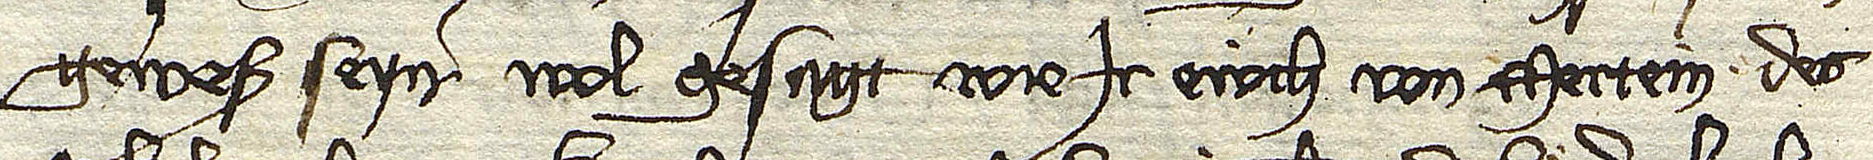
geweſ* ſeyn wol geſagt wie Ir ewch von Mertein . des
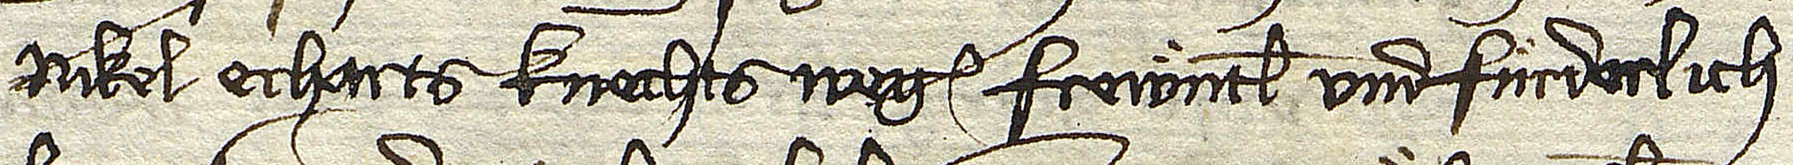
Nikel erharts knechts weg* frewntl* vnd fürderlich
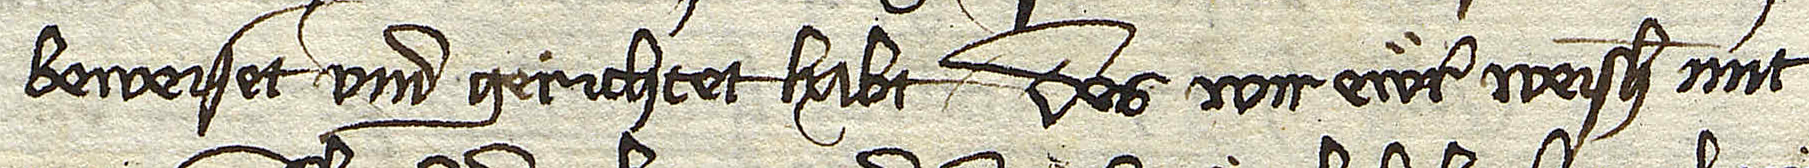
beweiſet vnd gerichtet habt / Des wir ew*r weiſh* mit
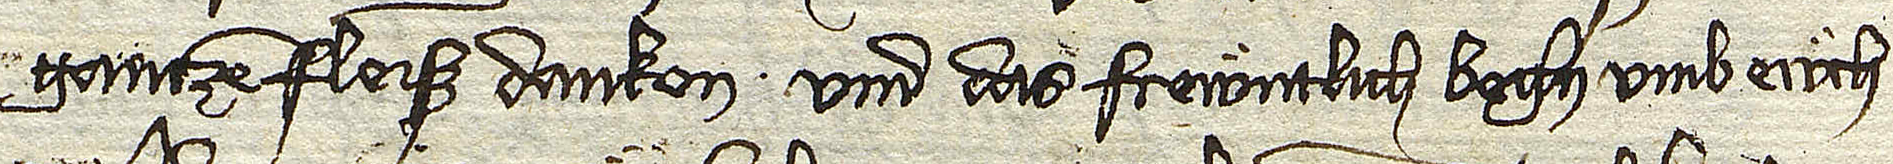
ganʒe* fleiſʒ danken . vnd das frewntlich beg*n vmb ewch
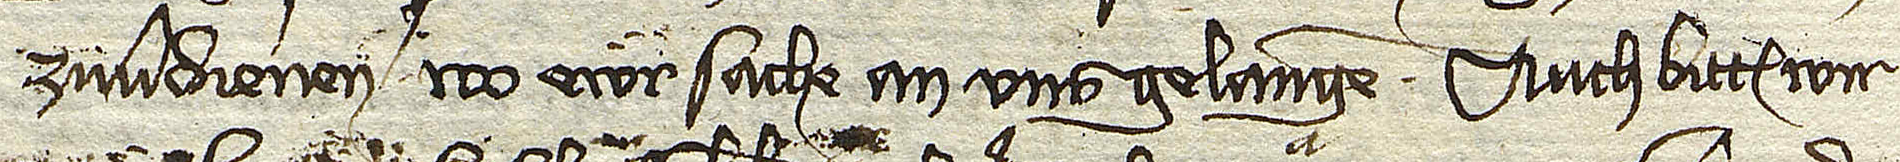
ʒuu*dienen wo ewr ſache an vns gelange* . Auch bitt* wir
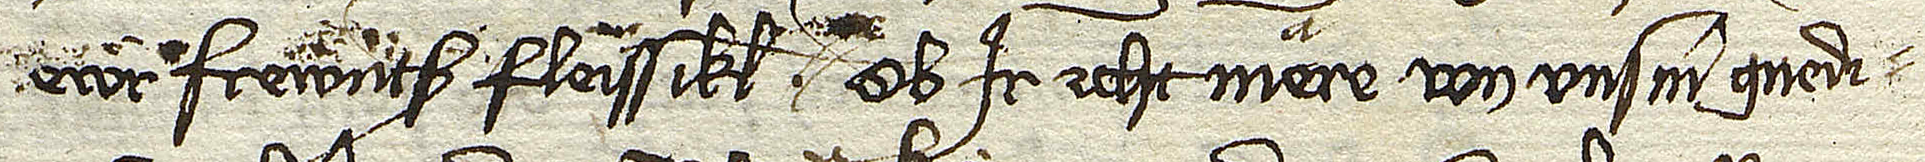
ewr frewntſ* fleiſſikl* . / Ob Ir icht mëre von vnſ*m gnedi =
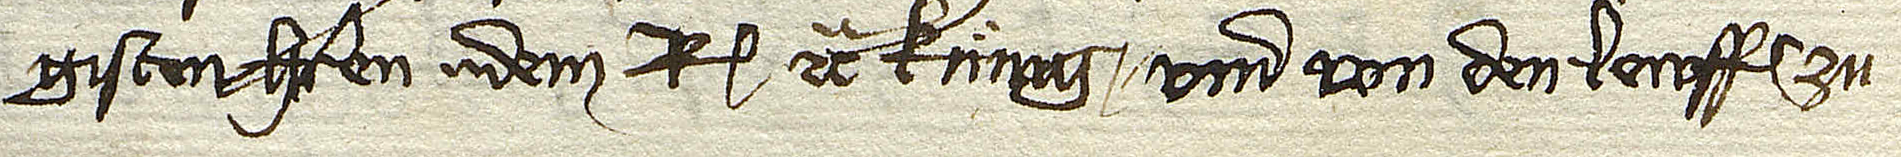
giſten h*ren ~ dem R* ec* künig / vnd von den lewff* ʒu
